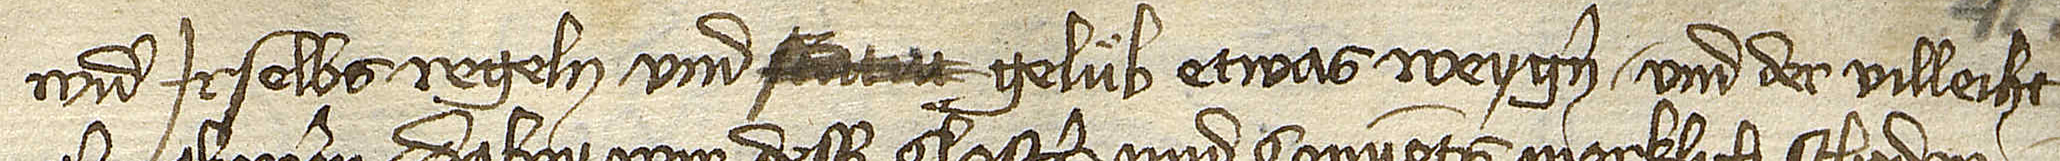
wid* Irſelbs regeln vnd ſtatut gelüb etwas weyg*n / vnd der villeiht
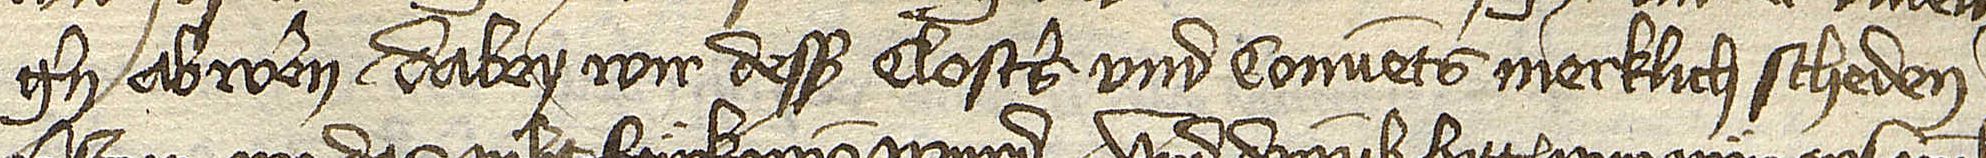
g*n abw*en / Dabey wir deſſ* Cloſt*s vnd Conue*ts merklich ſcheden
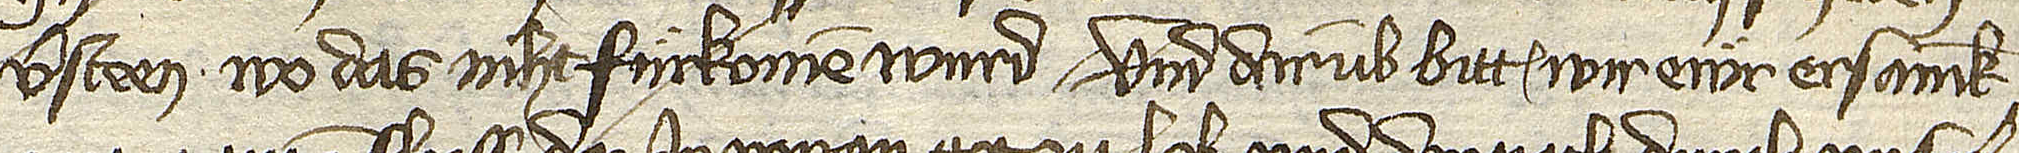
v*ſteen . wo das niht fürkome* wurd / Vnd darub* bitt* wir eẅr erſamk*
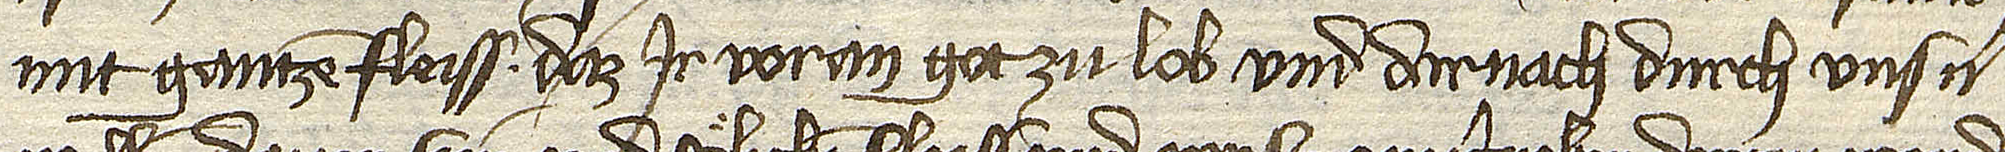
mit gancʒe* fleiſſ . daʒ Ir voran got ʒu lob vnd darnach durch vnſn*
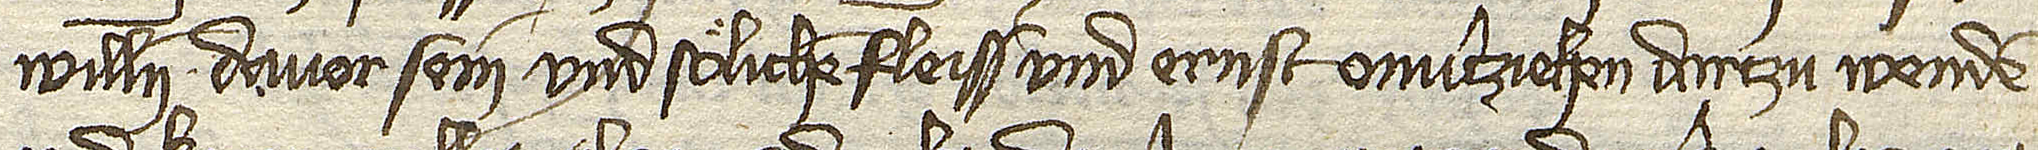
willn* dauor ſein vnd ſöliche* fleiſſ vnd ernſt onu*cʒiehen darcʒu wende*
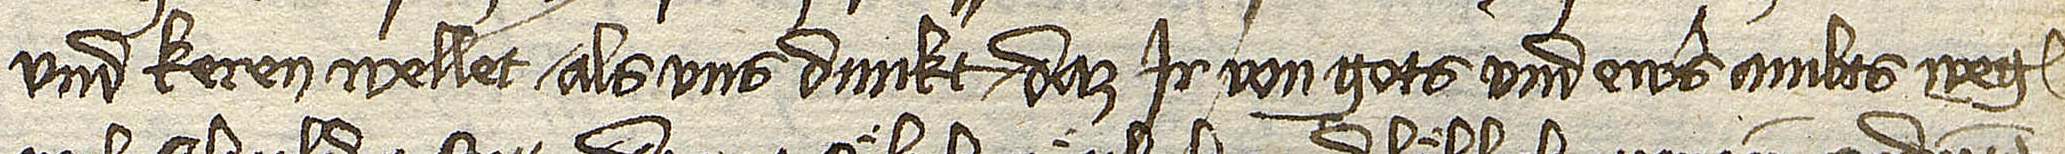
vnd keren wellet / als vns dunkt / daʒ Ir von gots vnd ew*s ambts weg*
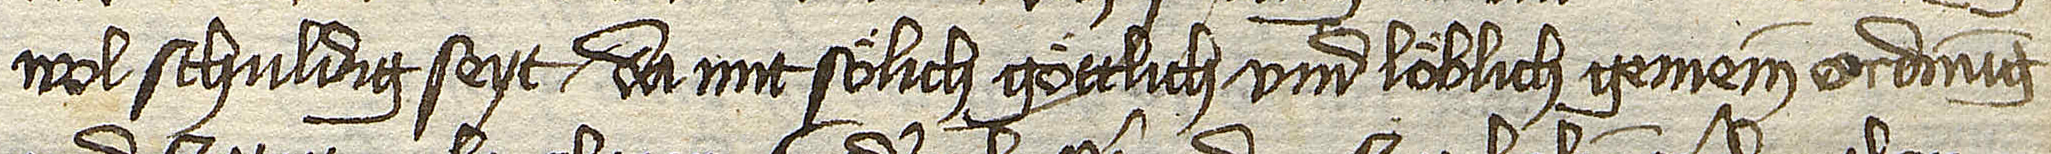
wol ſchuldig ſeyt / Da mit ſölich göttlich vnd löblich gemein Ordnu*g
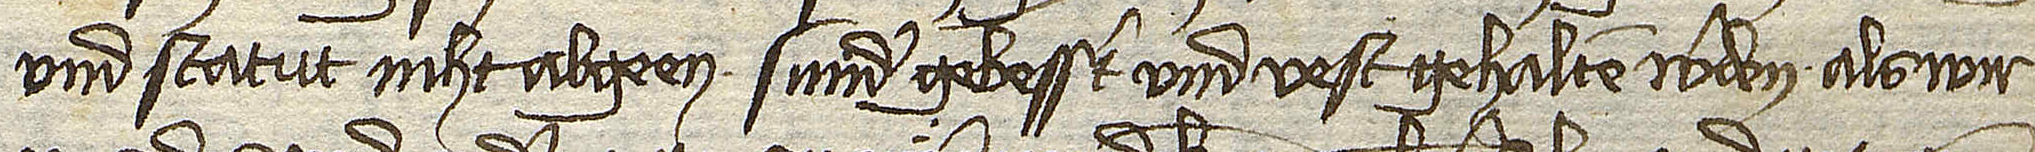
vnd ſtatut niht abgeen . ſund* gebeſſt* vnd veſt gehalte* w*den . als wir
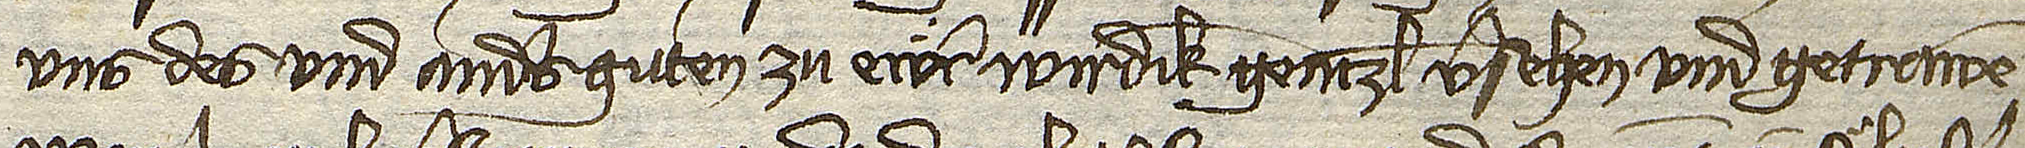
vns des vnd and*s guten ʒu eẅr* wirdik* gencʒl* v*ſehen vnd getrawe*
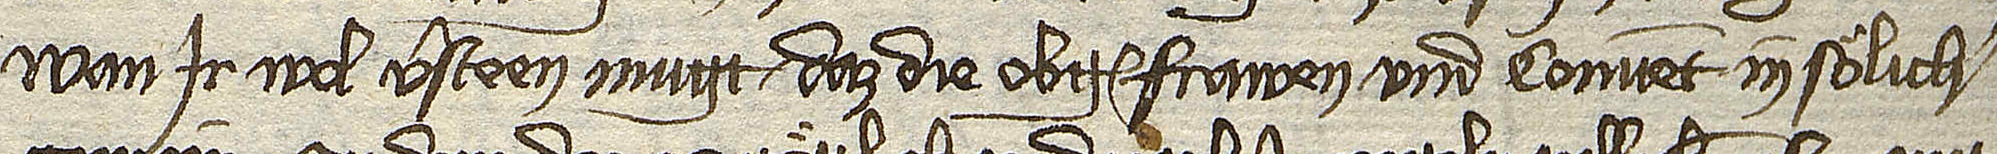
wan Ir wol v*ſteen mugt / daʒ die obg* frawen vnd Conue*t in ſölich*
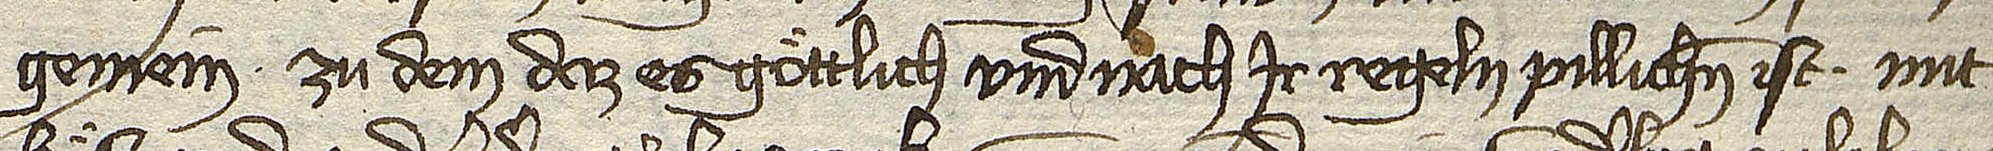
gemein . ʒu dem daʒ es göttlich vnd nach Ir regeln pillichn* iſt . mit
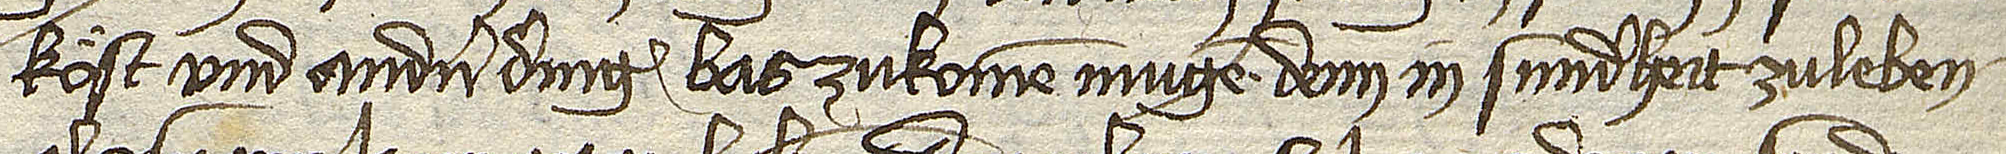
köſt vnd andn* ding* basʒukome* muge* . denn in ſund*heit ʒuleben
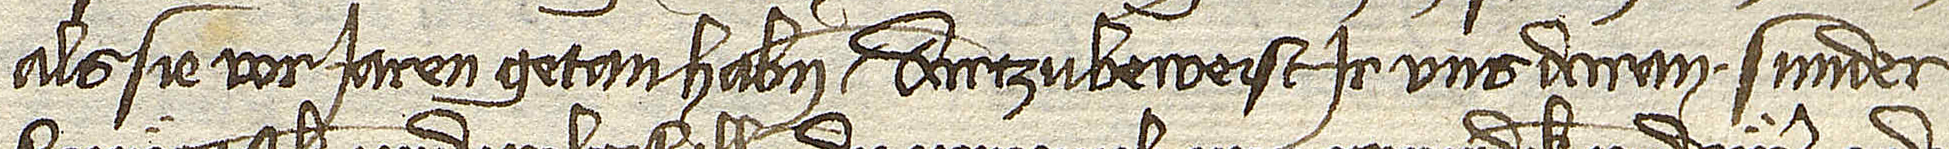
als ſie vor Iaren getan habn* / Darcʒu beweiſt Ir vns daran . ſunder
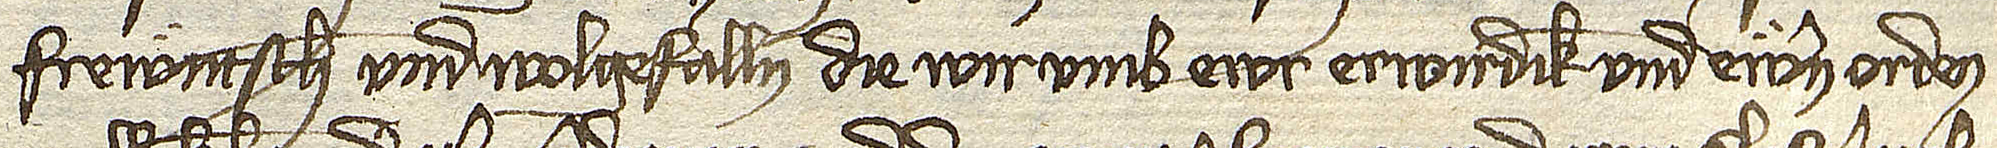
freẅntſch* vnd wolgefalln* die wir vmb ewr erwirdik* vnd eẅ*n orden
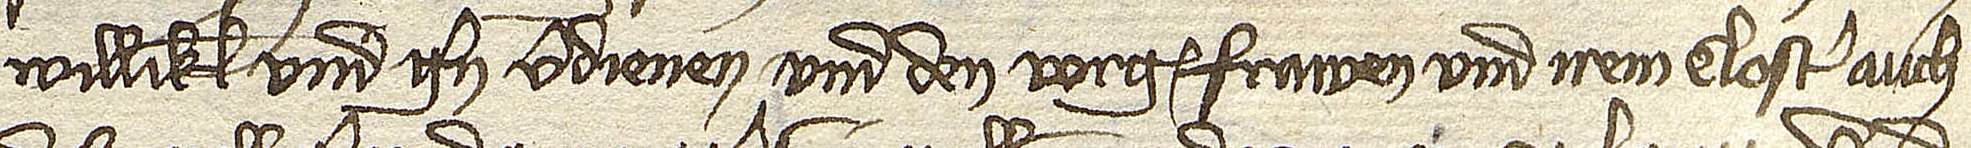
willikl* vnd g*n v*dienen / vnd den vorg* frawen vnd irem Cloſt* auch
